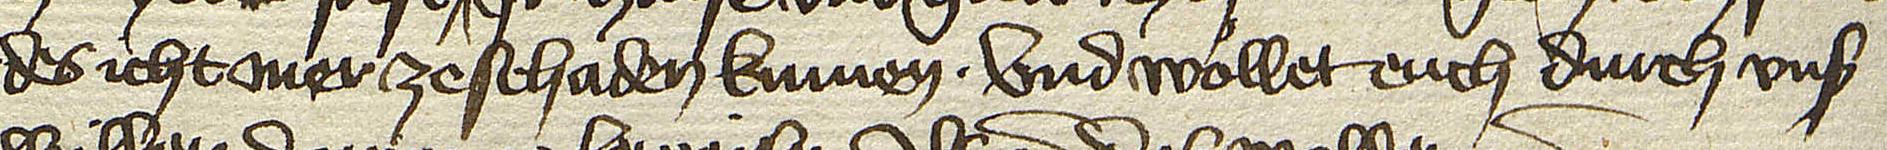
des icht mer cʒeſchaden kumen . vnd wöllet euch durch vnſ*
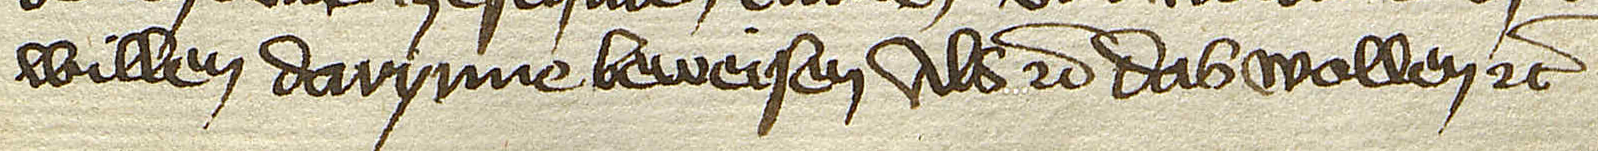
willen darynne beweiſen Als ec* das wollen ec*
